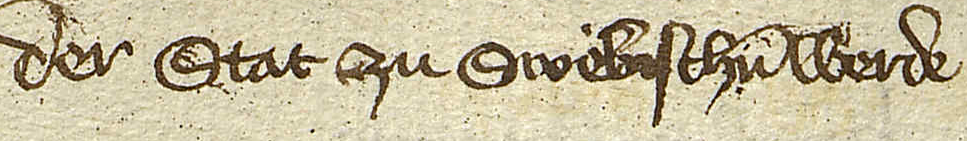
der Stat cʒu Swebiſchn* werde
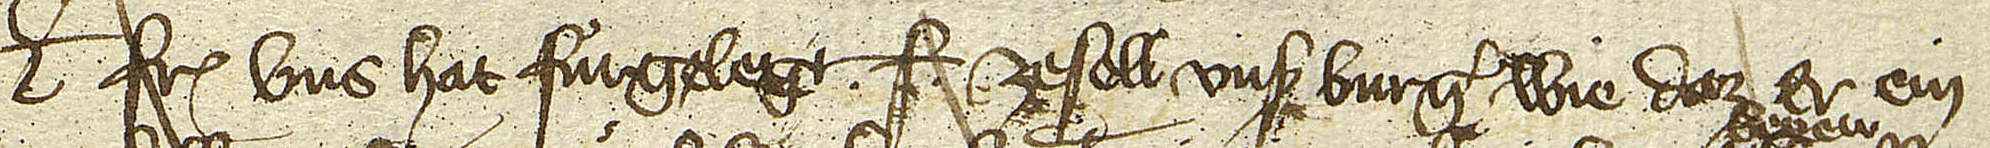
L* fr* vns hat fürgelegt . F . cʒeſell vnſ* burg* / wie daʒ Er ein
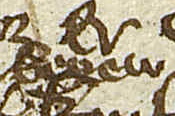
bey ew
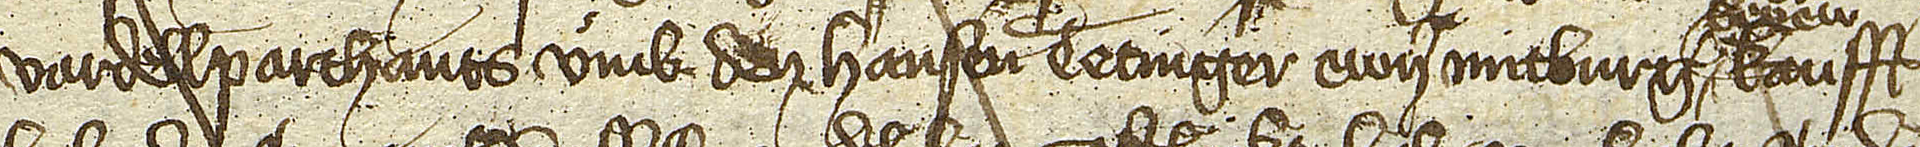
vardell parchants v̈mb den hanſen Tetinger ewn* mitburg* kaufft
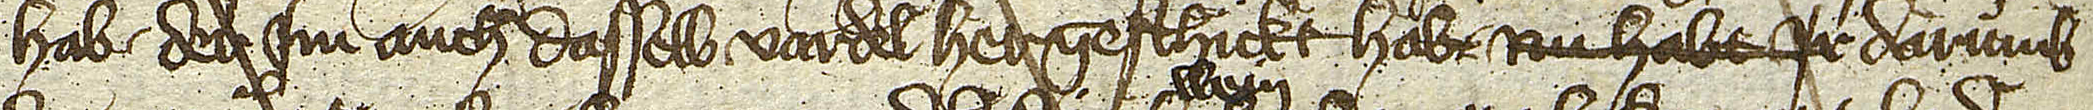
hab / der Im auch daſſelb vardel hergeſchickt hab / Nu habt Ir darümb
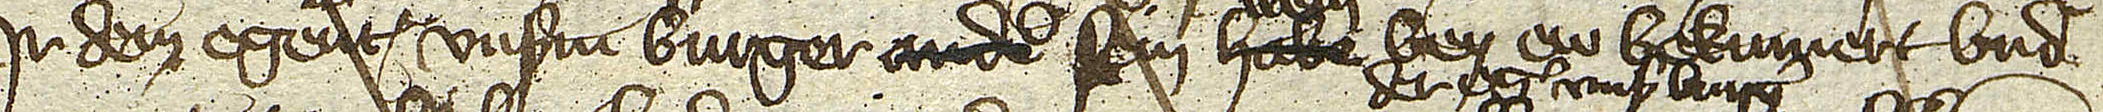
Ir dem egent* vnſ*m burger ande* ſein habe bey ew bekumert vnd
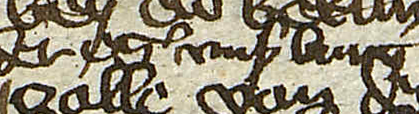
der eg* vnſ* burg*
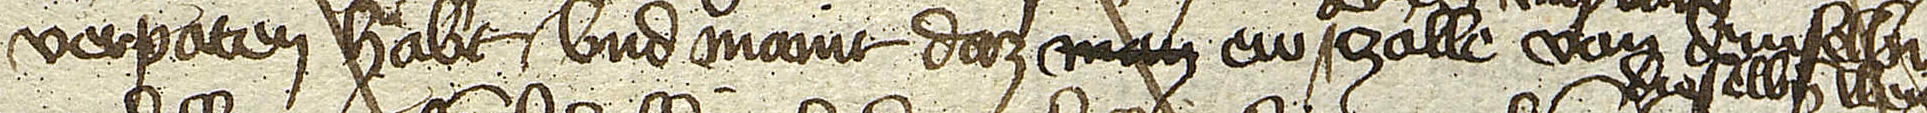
verpoten habt / vnd maint daʒ man ew cʒolle von demſelbn*
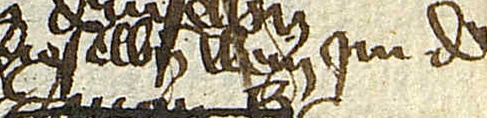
dieſelbn* wein Im er
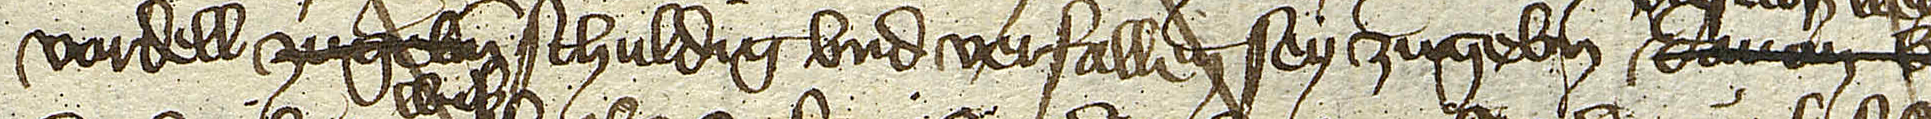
vardell cʒugebn* ſchuldig vnd verfallen ſey cʒugebn* / dauon Er
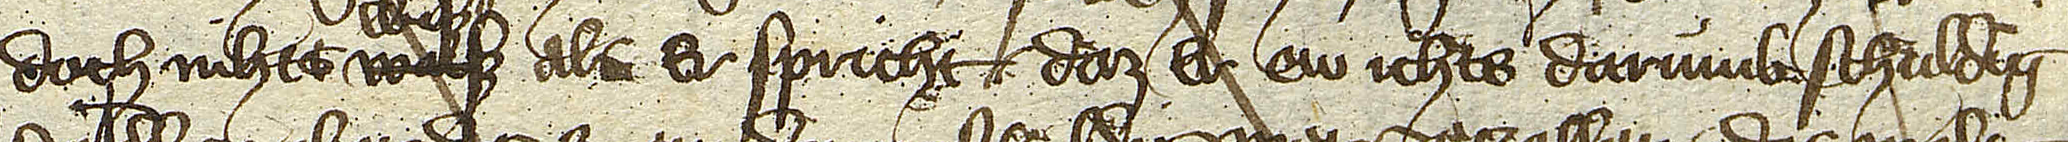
doch nihts waiſʒ als Er ſpricht / daʒ Er ew ichts darümb ſchuldig
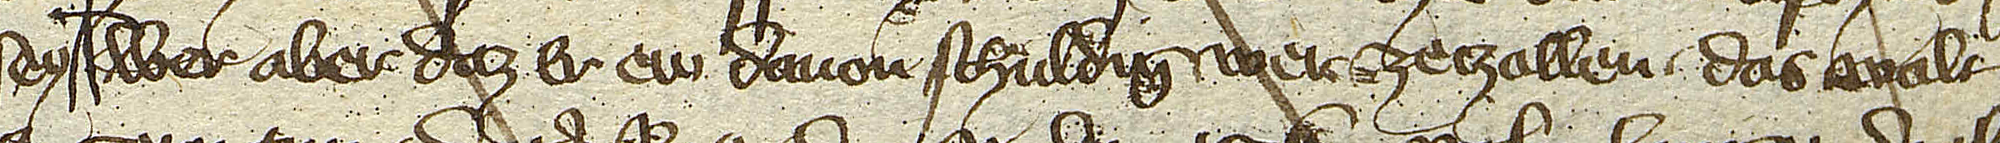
ſey / wer aber daʒ Er ew dauon ſchuldig wer cʒecʒollen / das wolt
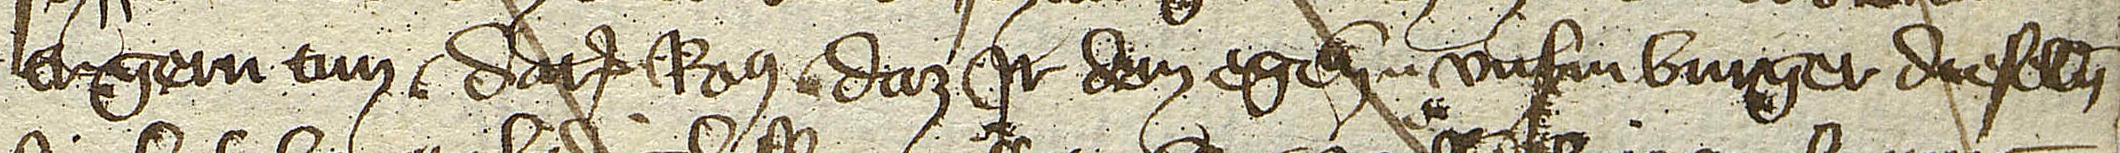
er gern tun / Dar* Ro* / daʒ Ir dem egen* ~ vnſ*m burger dieſelbn*
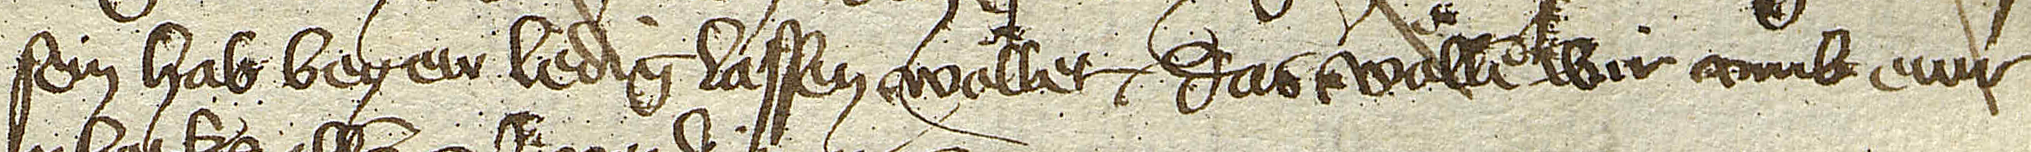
ſein hab bey ew ledig laſſen wöllet / Das wölle* wir vmb ewr
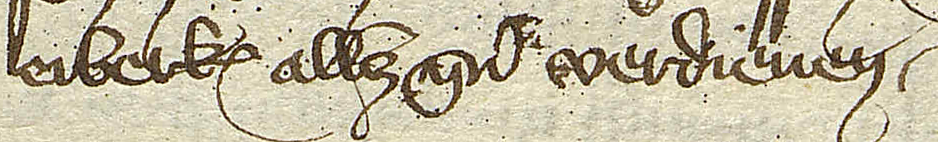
erberk* allcʒ* gn* verdienen /
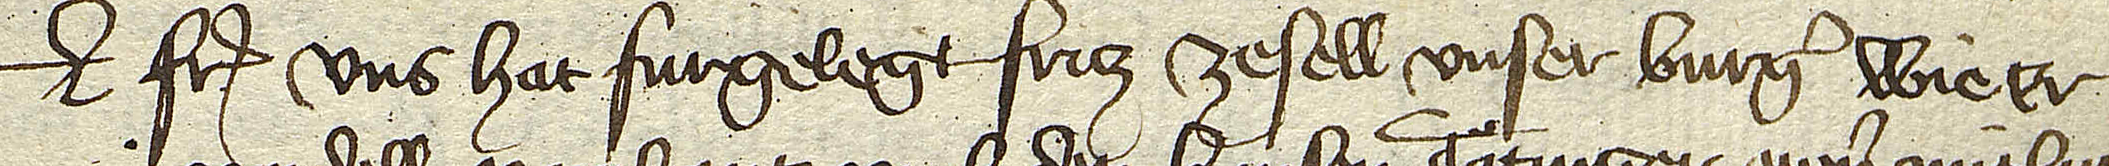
L* fr* vns hat furgelegt fricʒ cʒeſell vnſer burg* wie Er
